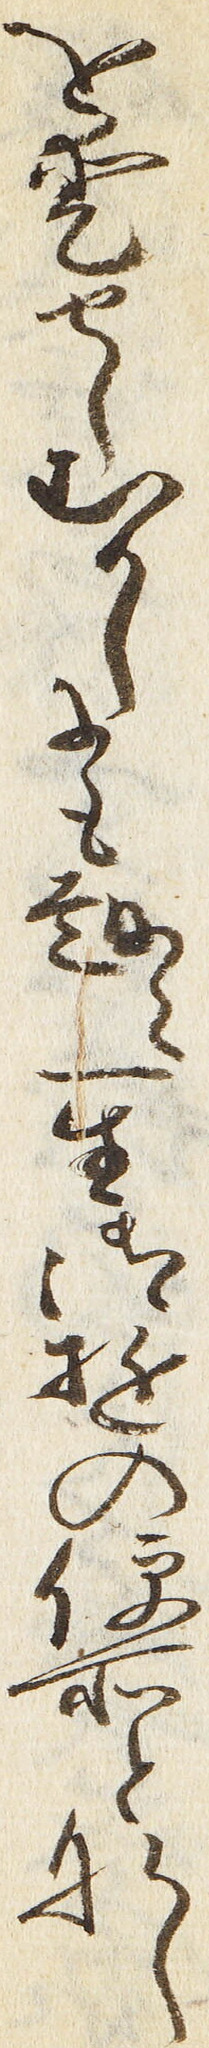を愛せしむかしにも一生御遊の便所となし
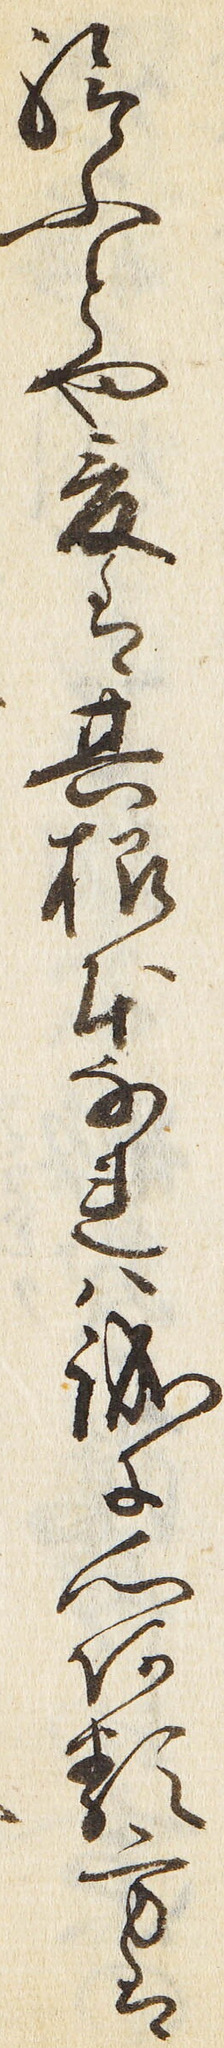給ふとや爰は其根本なれは誠に心ある方は
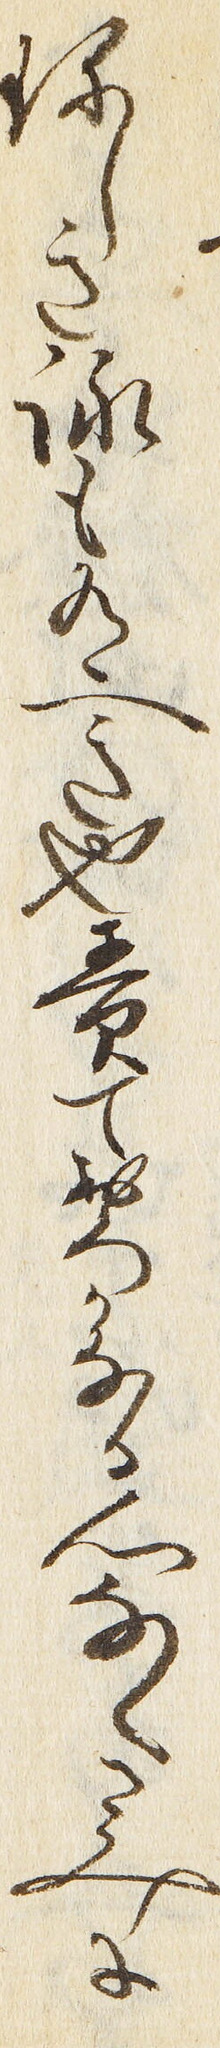珎しき詠も有へき也責ておろかなる心なくさみに
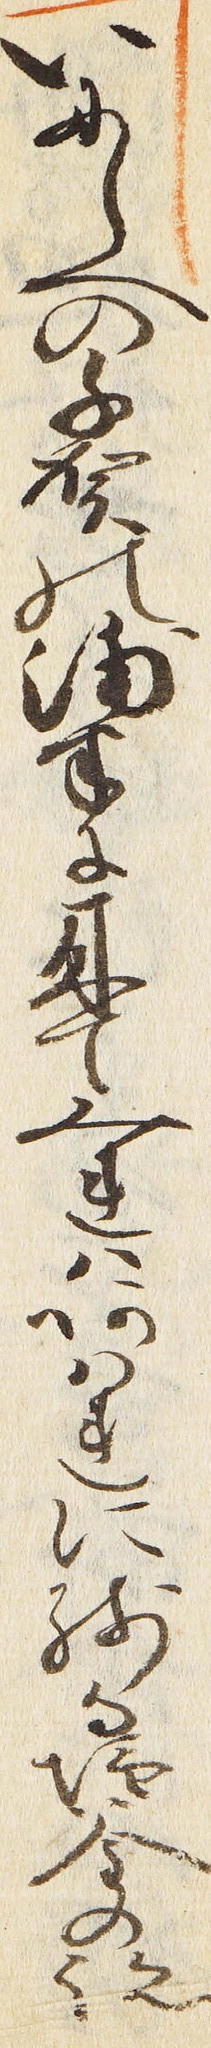「いにしへの千賀の浦半に来てみれはあはれに残る塩釜の跡
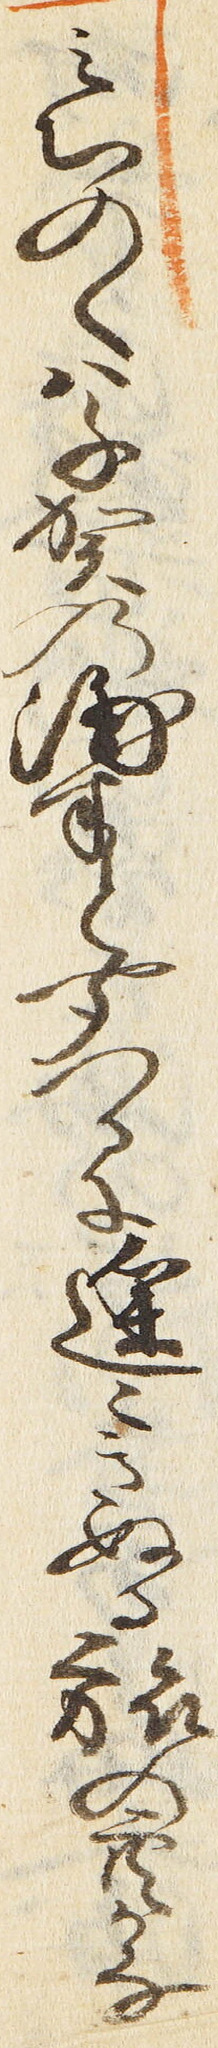「みちのくは千賀の浦半と聞つるに遥々きぬる旅の空かな
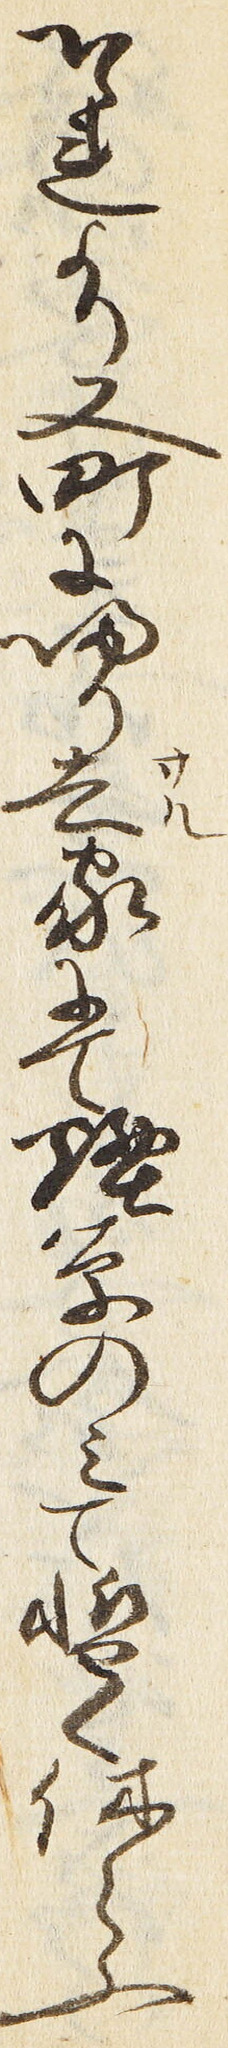それより又町に帰り去家にて煙草のみて暫く休らふ
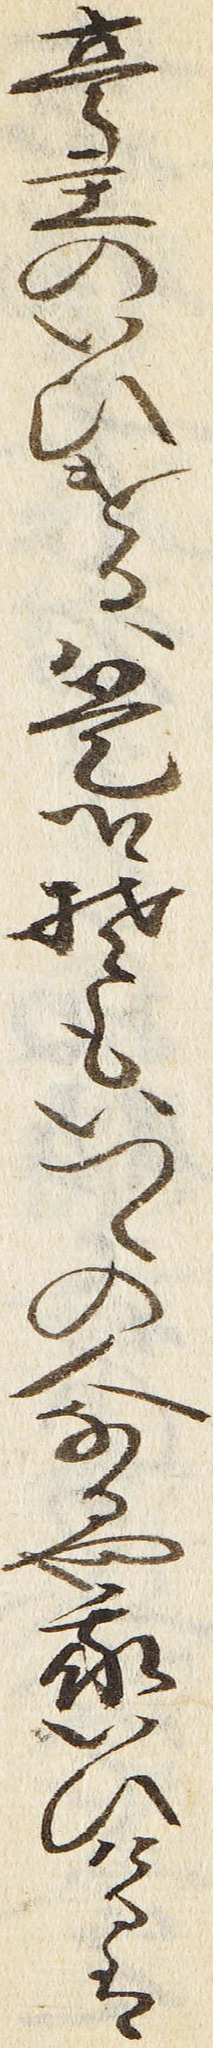亭主のいひけるは是そそもいつくの人なるや我いひけるは
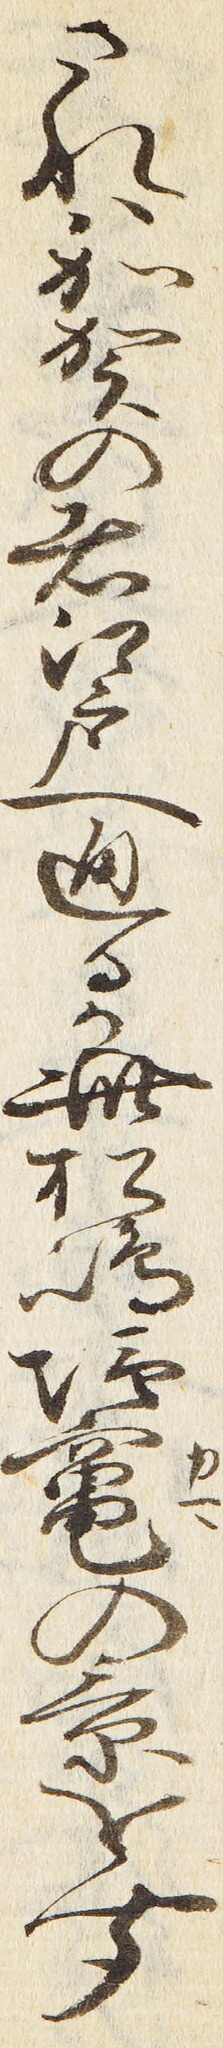されは加賀の者江戸へ通るか此松嶋塩竃の景を聞
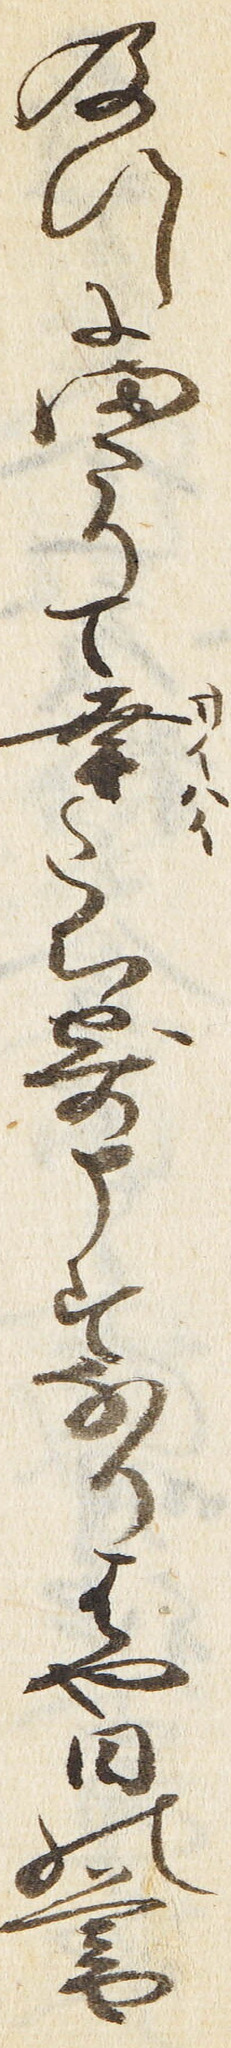及ひしにまさりて幸たち寄申すなりはや日の暮
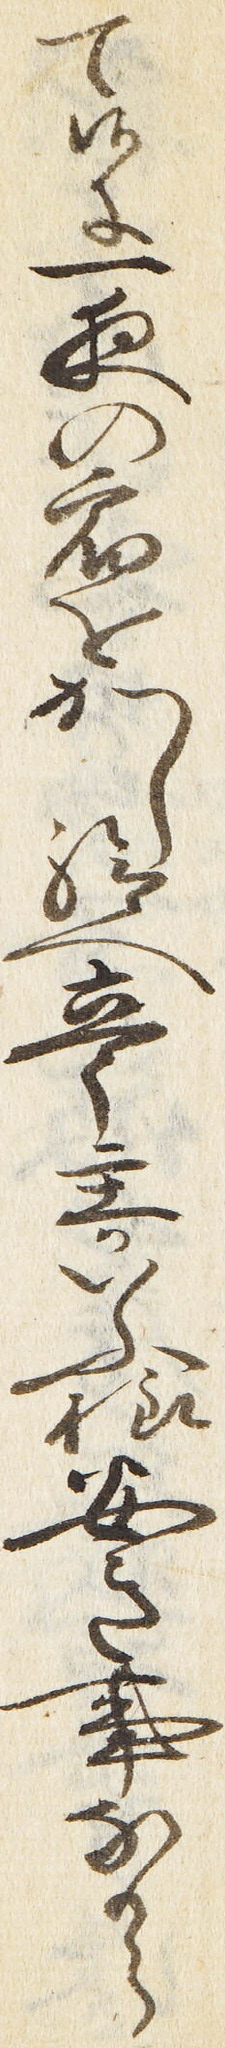て候に一夜の宿をかし給へ亭主かいふ様安き事なから
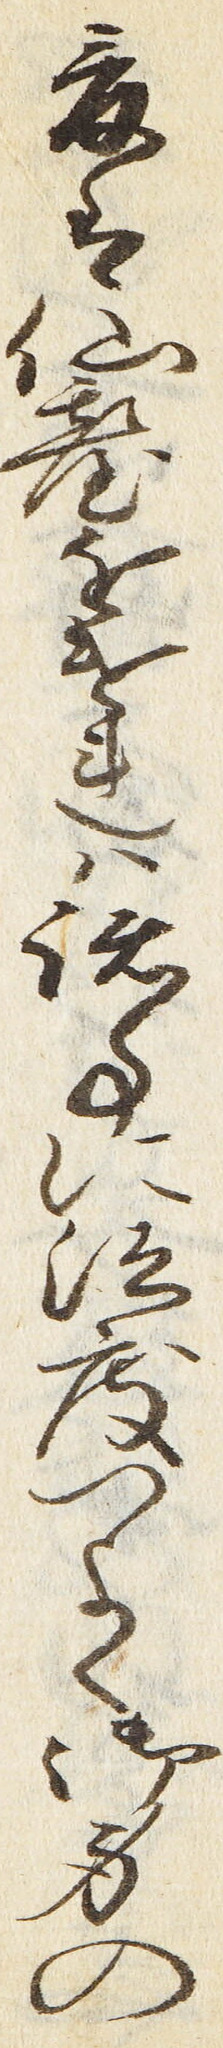爰は仙台近けれは諸事に法度つよく御身の
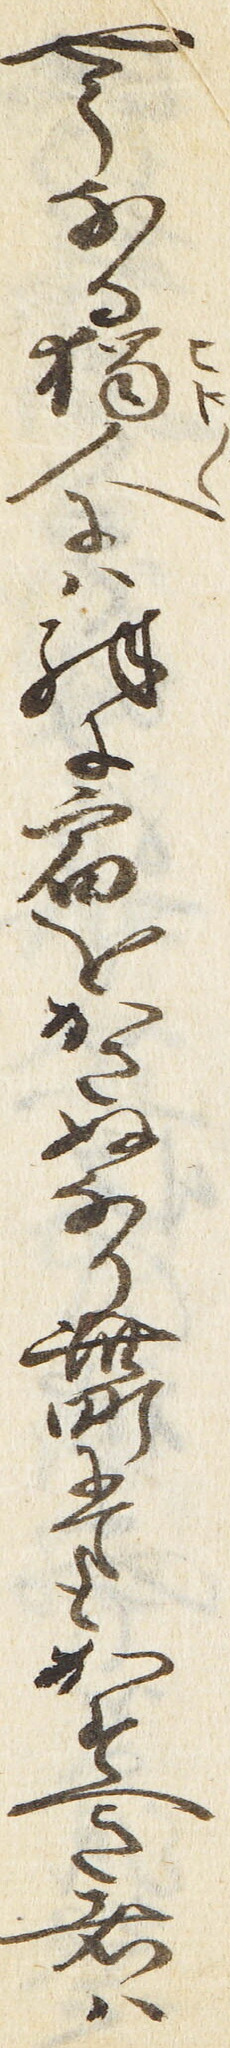やうなる独人には殊に宿をかさぬなり此町にてもかすへき者は
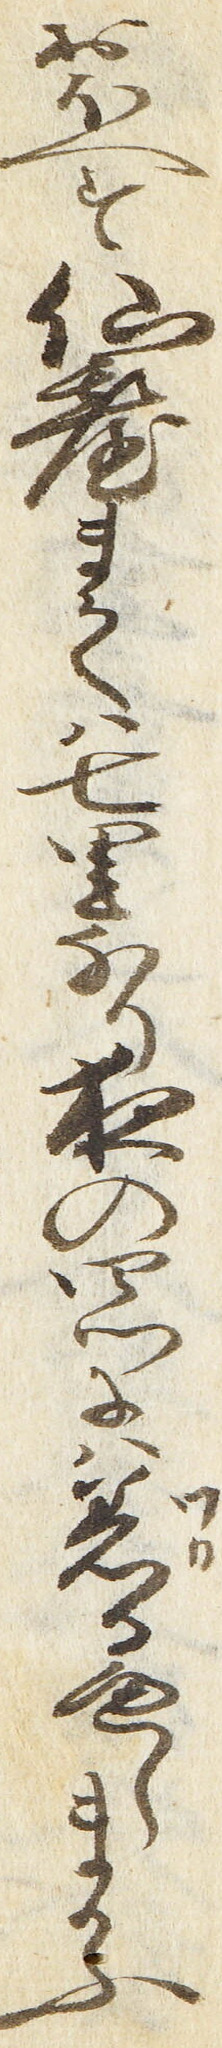おほへす仙台まては七里なり夜の四ツには着るへしまかふ
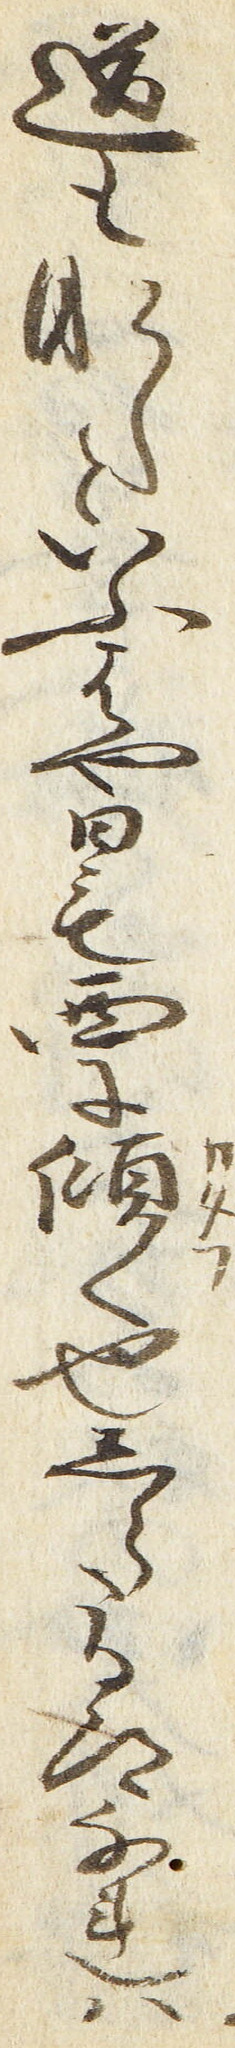道もなしといふはや日も西に傾く也しらさる道なれは

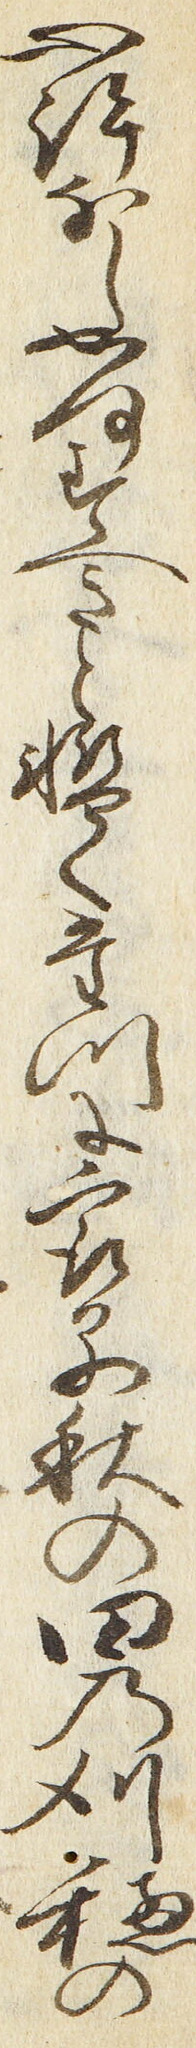心許なし如何すへきと暫くたつに最早秋の田の刈穂の
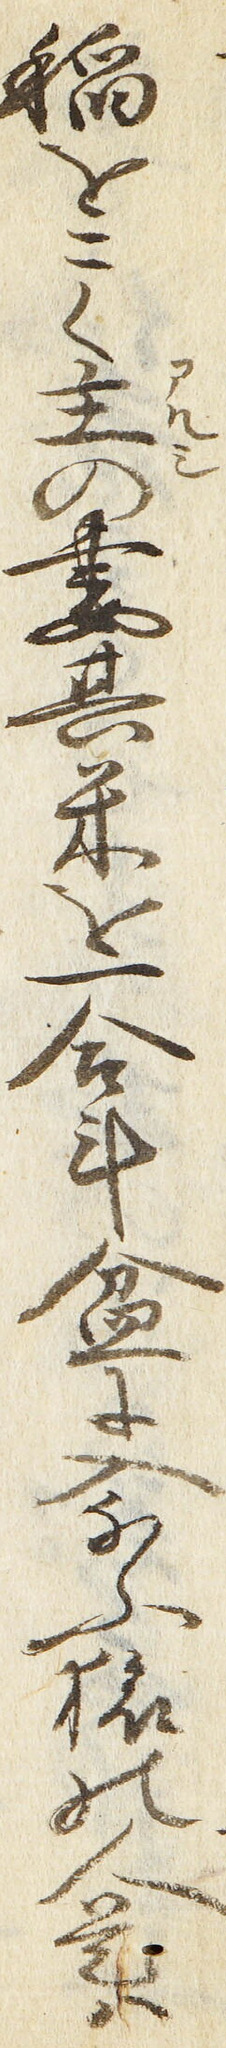稲をこく主の妻其米を一合計盆に入なふ旅の人是は
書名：海陸世話日記
